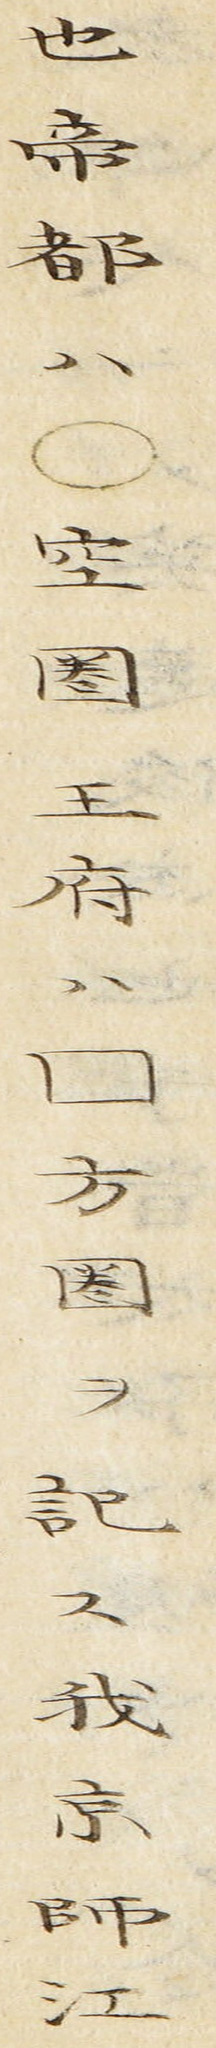也帝都ハ〇空圏王府ハ方圏ヲ記ス我京師江
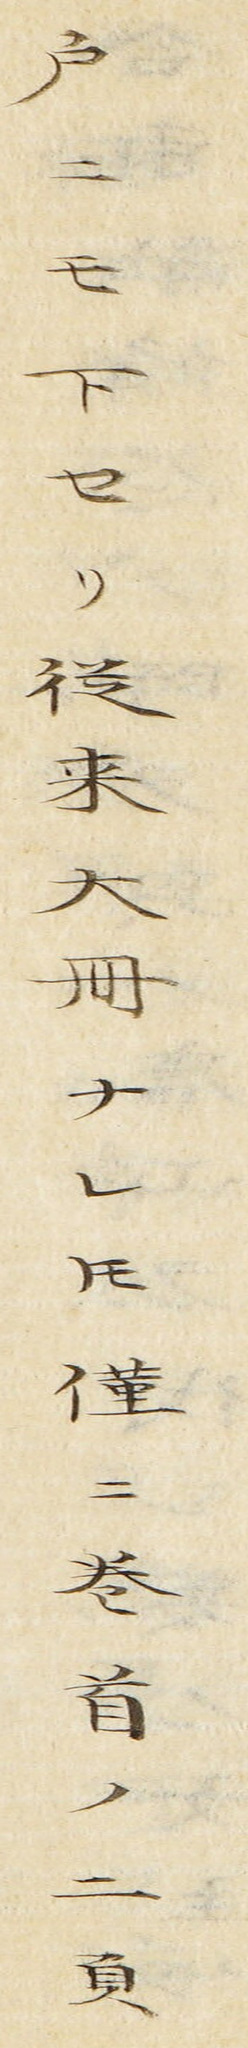戸ニモ下セリ従来大冊ナレトモ僅ニ巻首ノ二頁
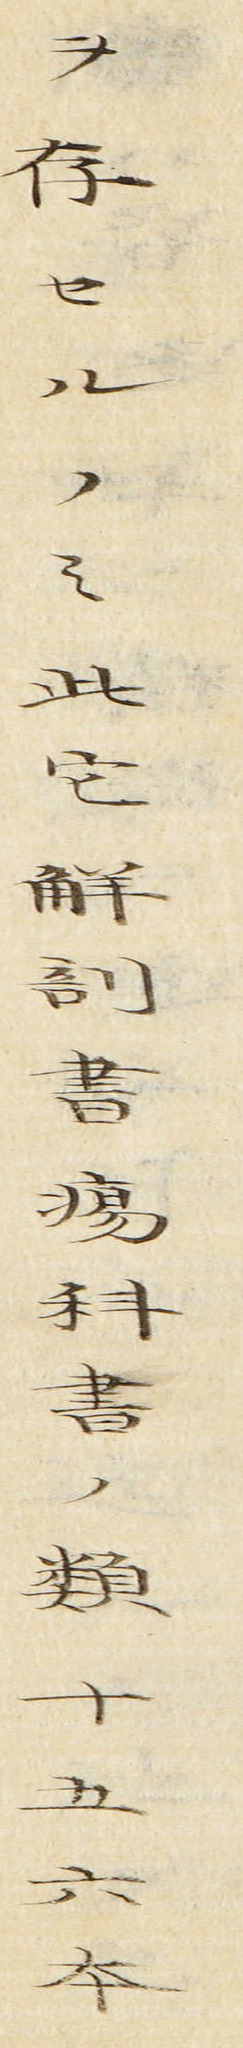ヲ存セルノミ此它觧剖書瘍科書ノ類十五六本
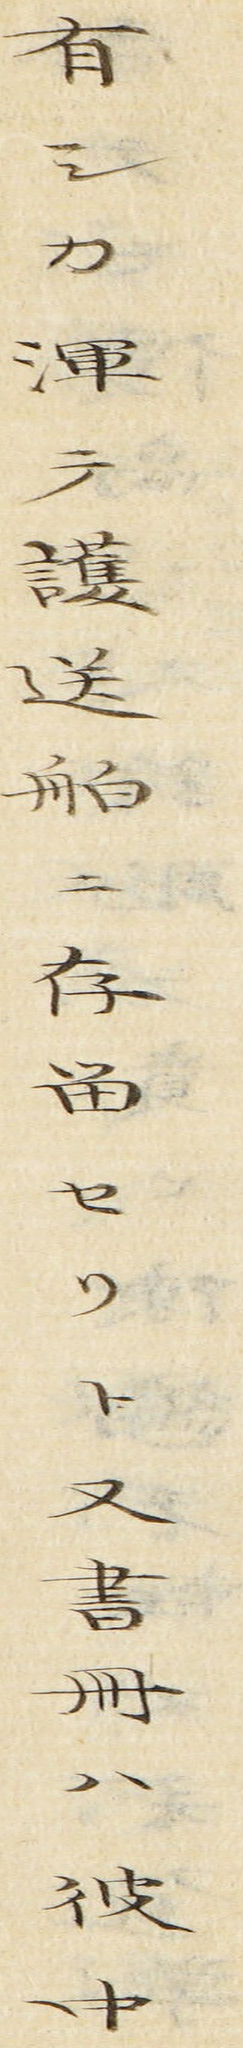有シカ渾テ護送舶ニ存留セリト又書冊ハ彼中

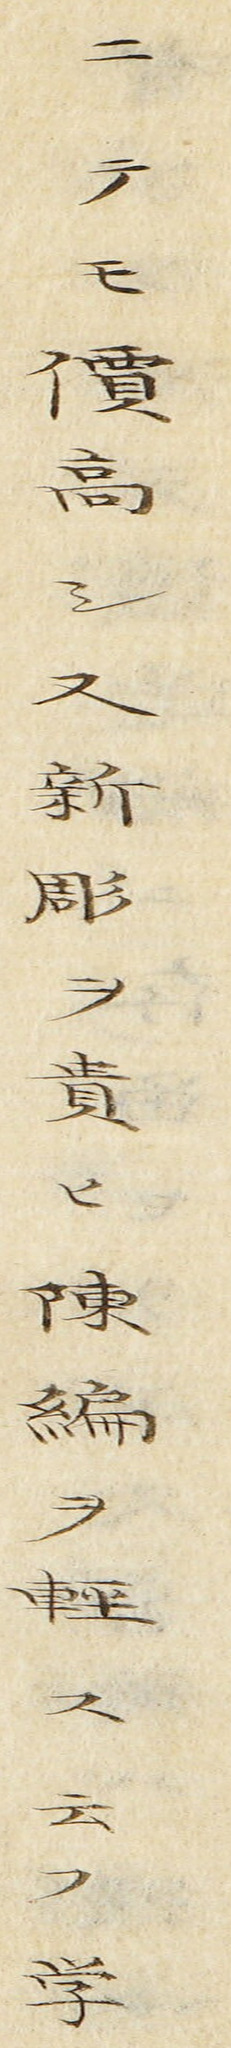ニテモ價高シ又新彫ヲ貴ヒ陳編ヲ軽ス云フ学
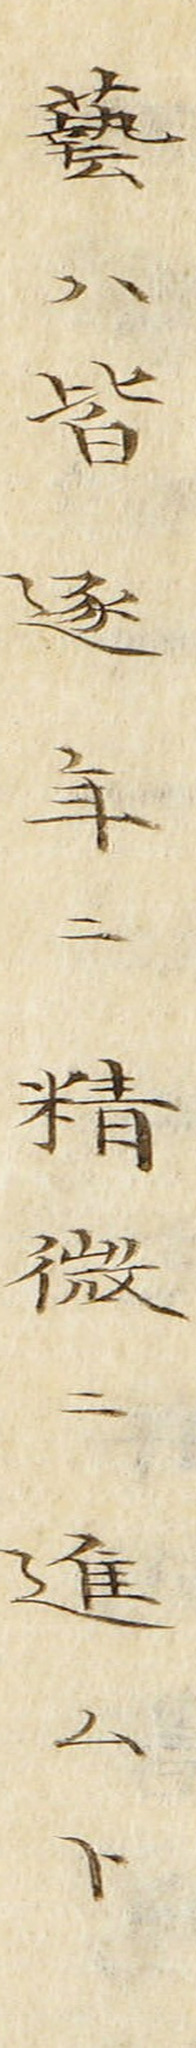藝ハ皆逐年ニ精微ニ進ムト
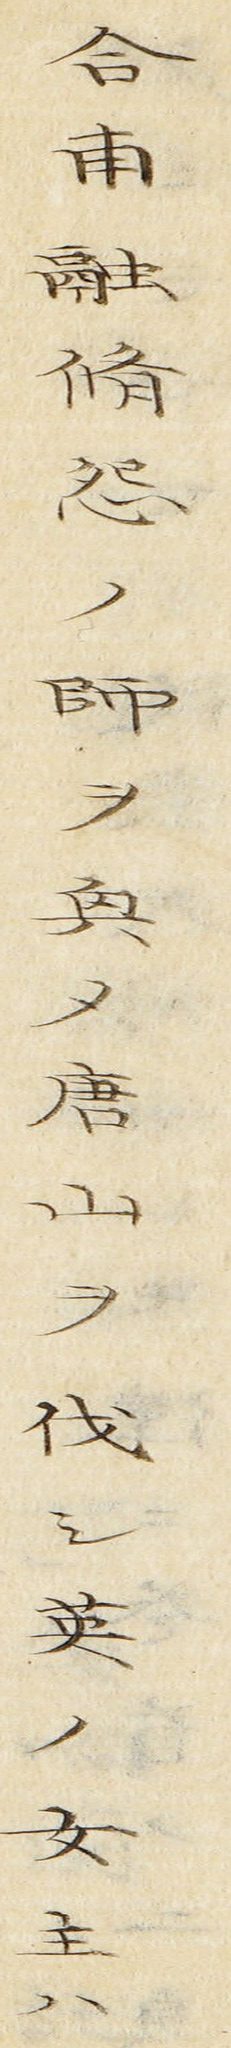合甫融脩怨ノ師ヲ奥シテ唐山ヲ伐シ英ノ女主ハ
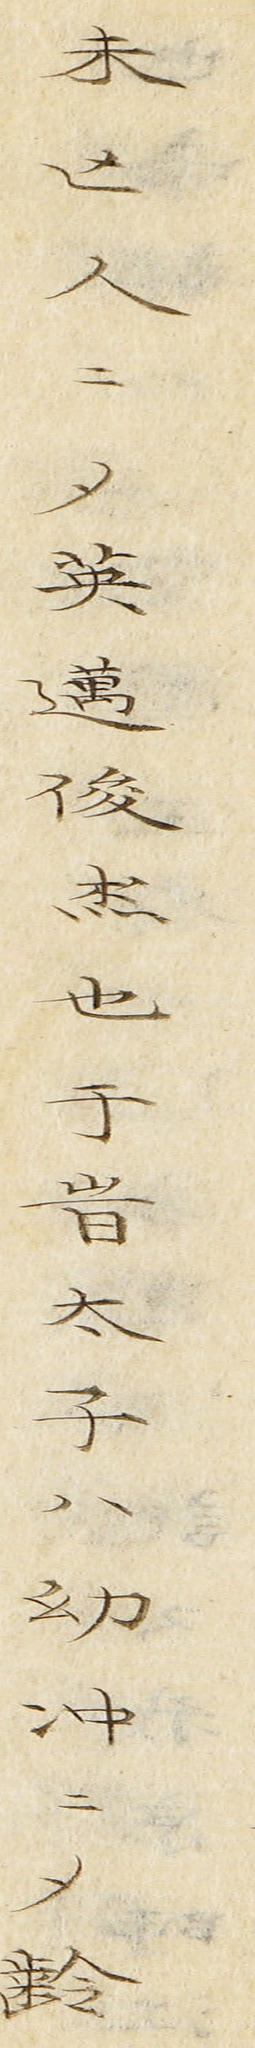未亡人ニシテ英邁俊杰也于旹太子ハ幼冲ニシテ齢
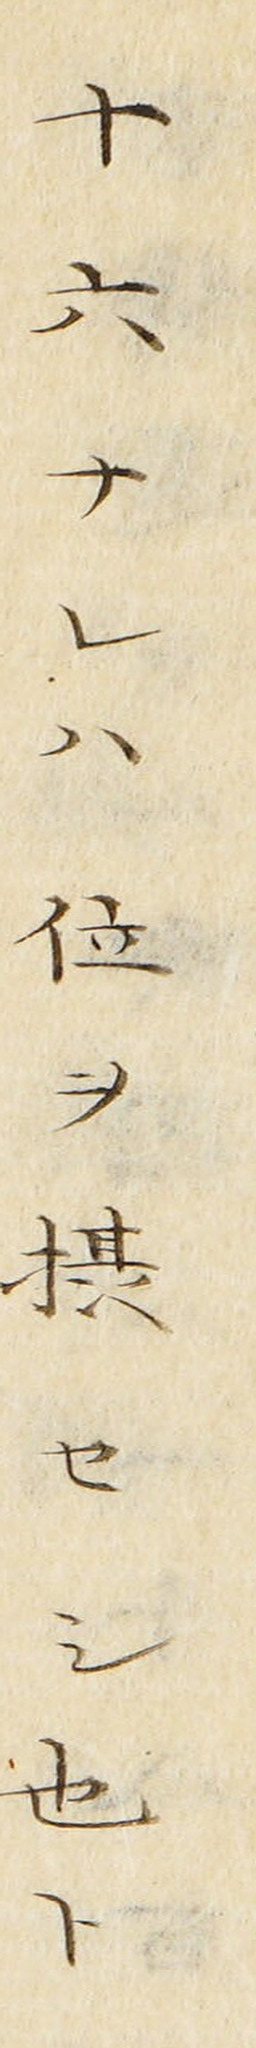十六ナレハ位ヲ摂セシ也ト
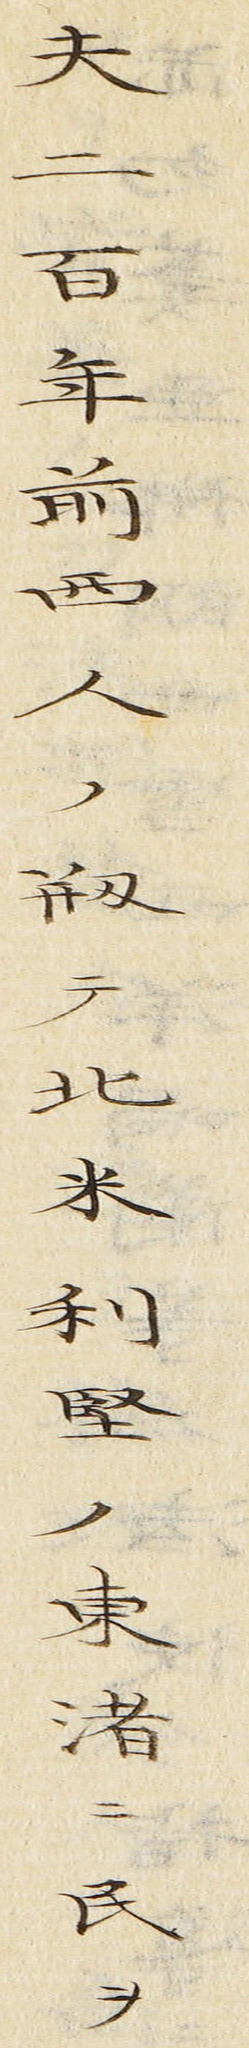夫二百年前西人ノ剏テ北米利堅ノ東渚ニ民ヲ
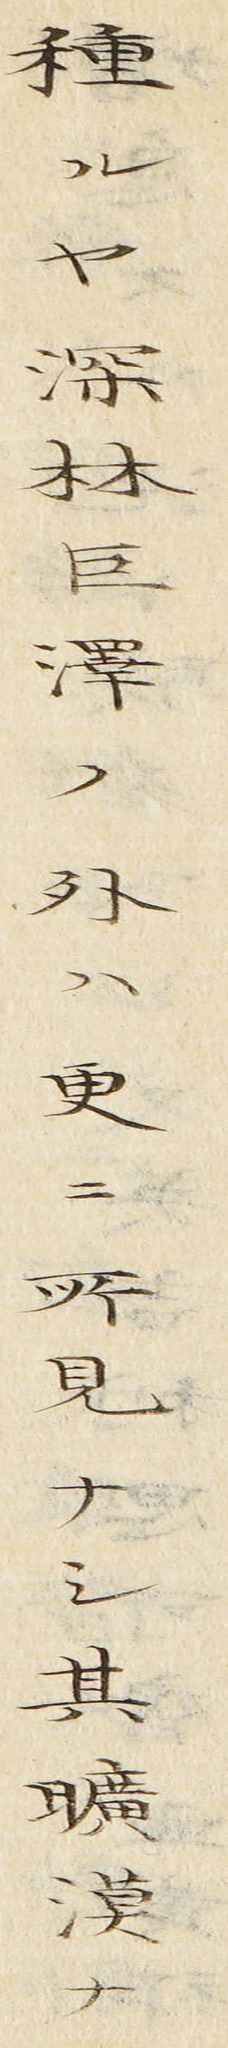種ルヤ深林巨澤ノ外ハ更ニ所見ナシ其曠漠ナ
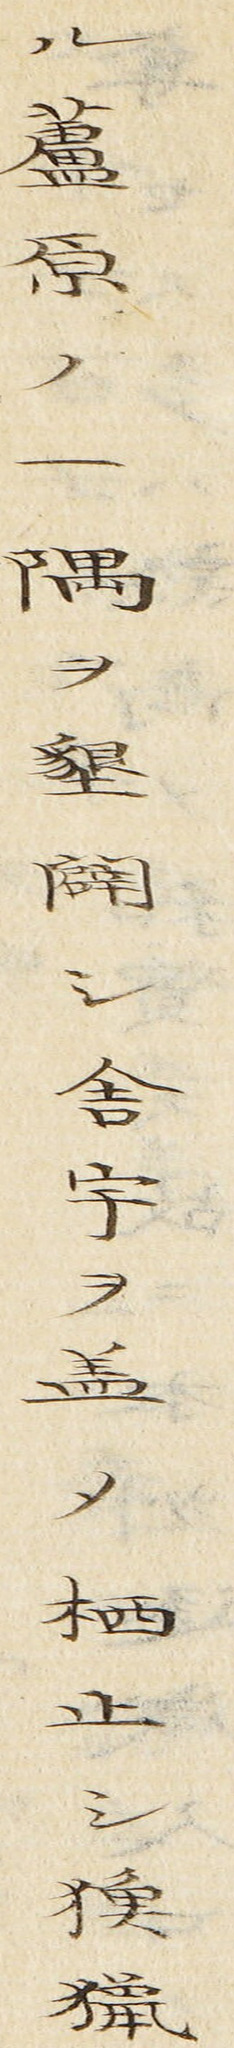ル蘆原ノ一隅ヲ墾闢シ舎宇ヲ盖シテ栖止シ猟
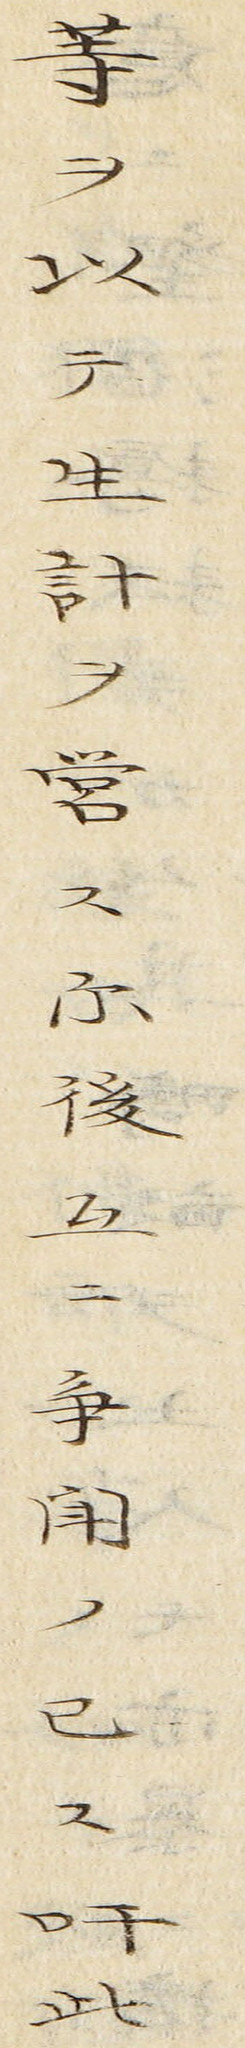等ヲ以テ生計ヲ営ス尓後互ニ争閗ノ已ス吁此
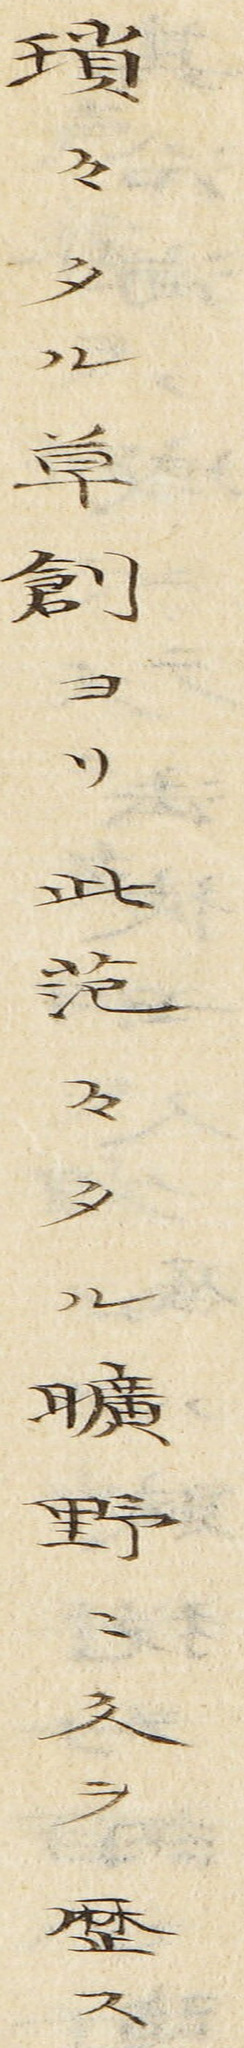瑣々タル草創ヨリ此范々タル曠野ニ人？ヲ歴ス
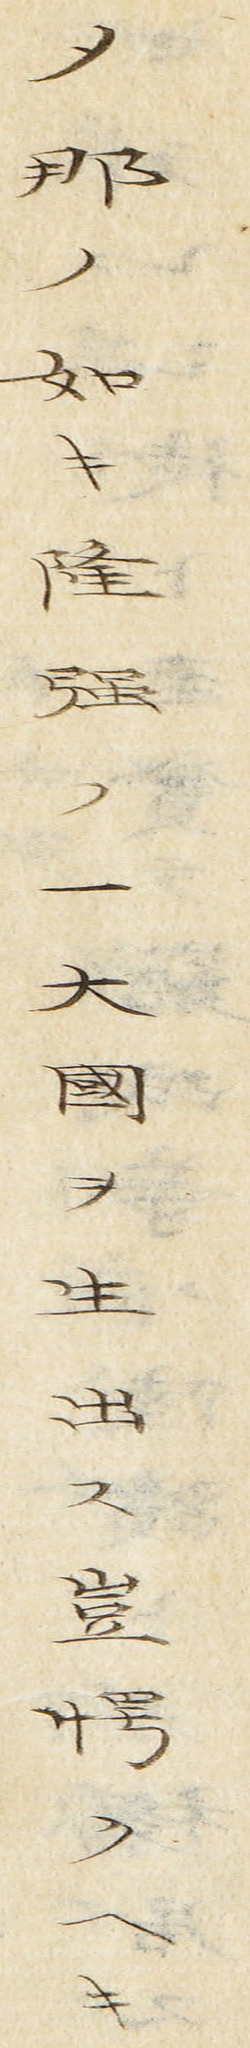シテ那ノ如キ隆強ノ一大國ヲ生出ス豈愕クヘキ
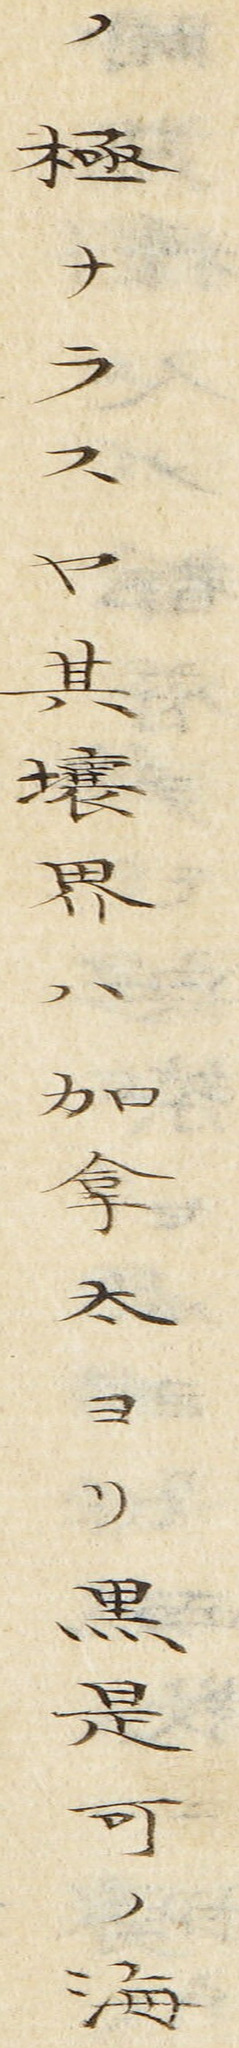ノ極ナラスヤ其壌界ハ加拿太ヨリ黒是可ノ海
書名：蕃談
